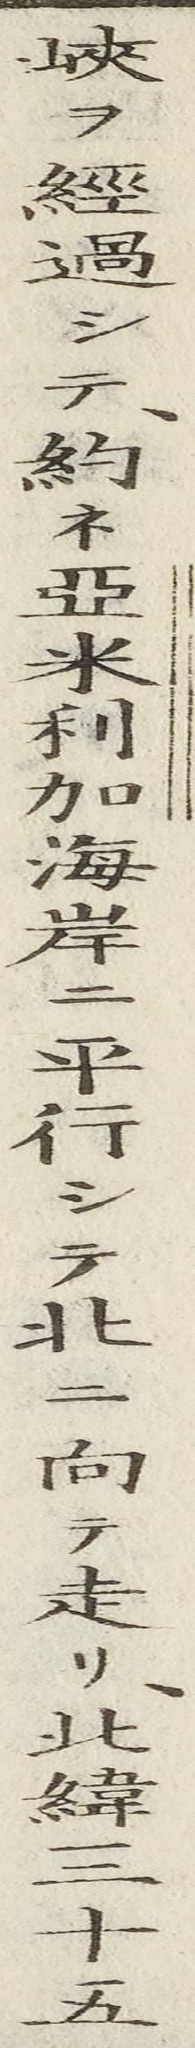峡ヲ経過シテ、約ネ亜米利加海岸ニ平行シテ北ニ向テ走リ、北緯三十五
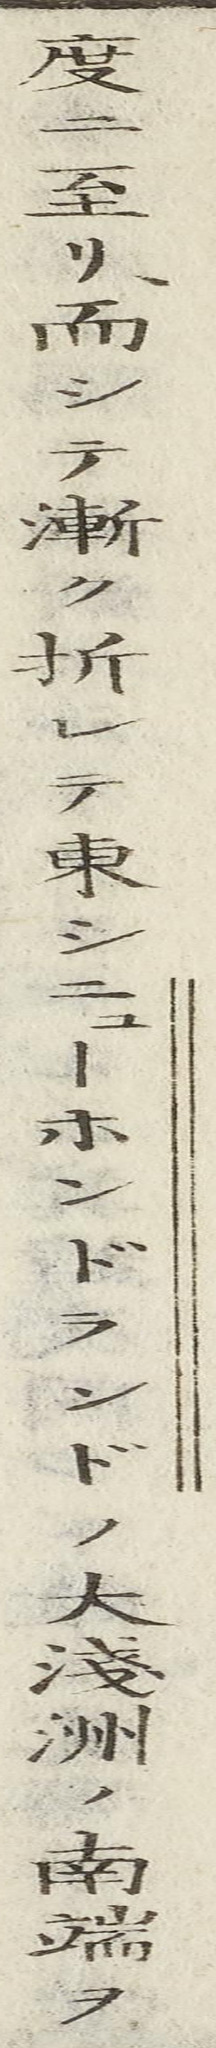度ニ至リ、而シテ漸ク折レテ東シニューホンドランドノ大浅洲ノ南端ヲ
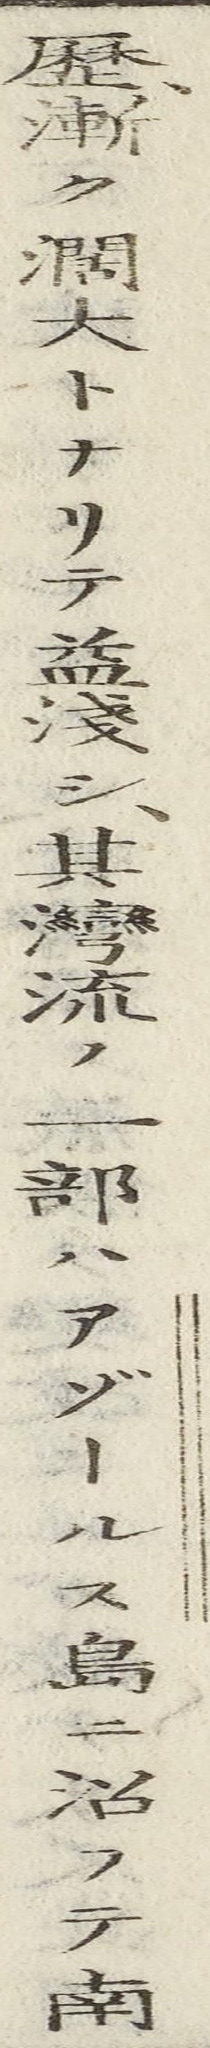歴、漸ク濶大トナリテ益浅シ、其湾流ノ一部ハアゾールス島ニ沿フテ南
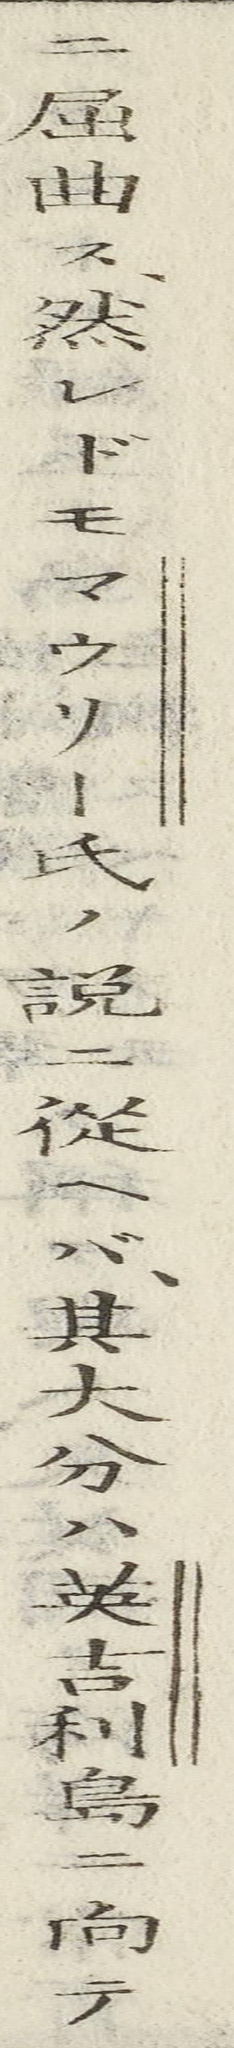ニ屈曲ス、然レドモマウリー氏ノ説ニ従ヘバ、其大分ハ英吉利島ニ向テ
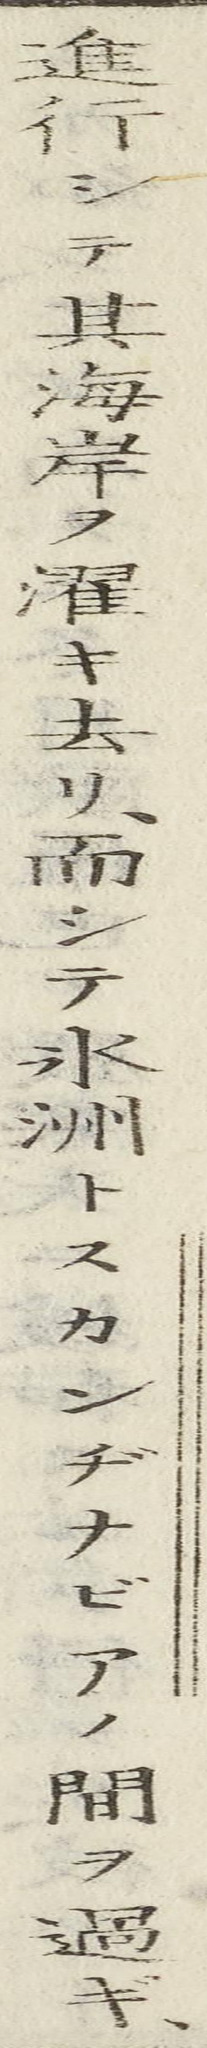進行シテ其海岸ヲ濯キ去リ、而シテ氷洲トスカンヂナビアノ間ヲ過ギ、
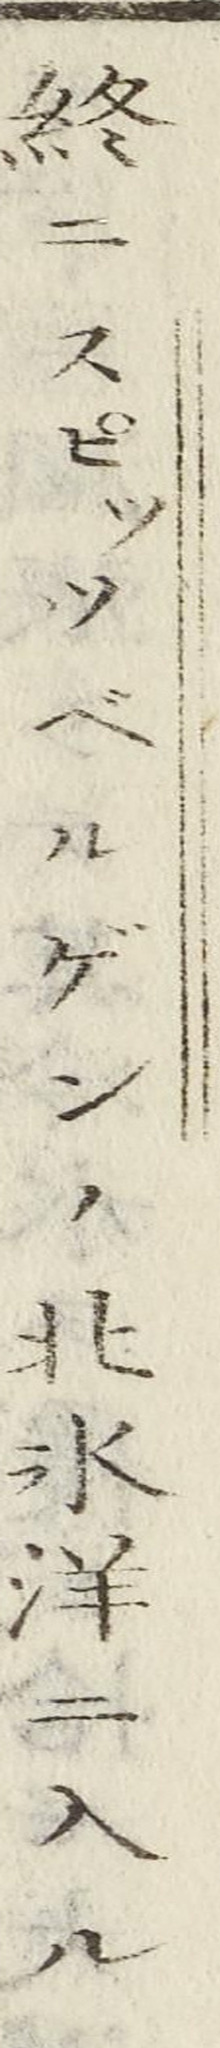終ニスピッツベルゲンノ北氷洋ニ入ル
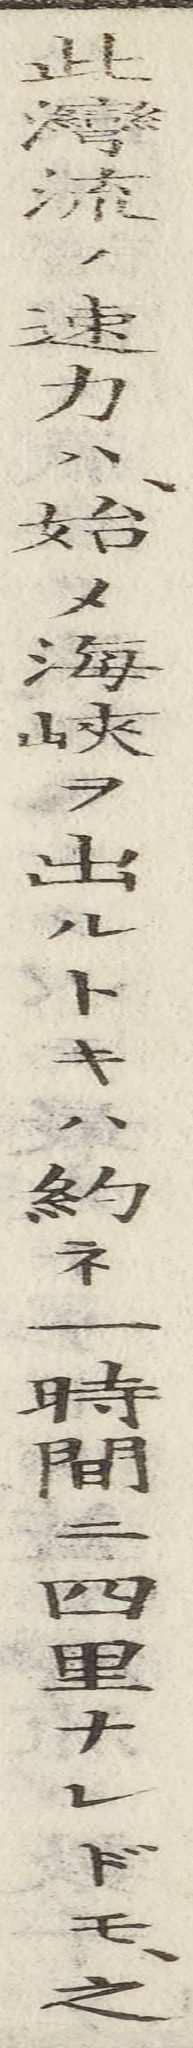此湾流ノ速力ハ、始メ海峡ヲ出ルトキハ約ネ一時間ニ四里ナレドモ、之
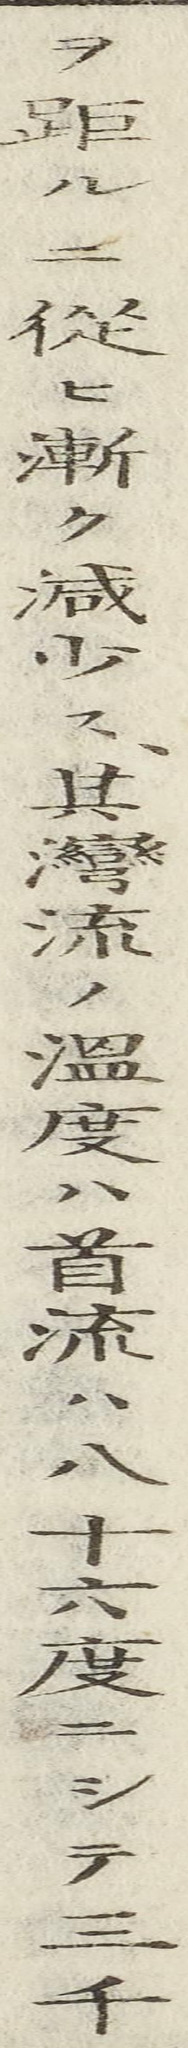ヲ距ルニ従ヒ漸ク減少ス、其湾流ノ温度ハ首流ハ八十六度ニシテ三千
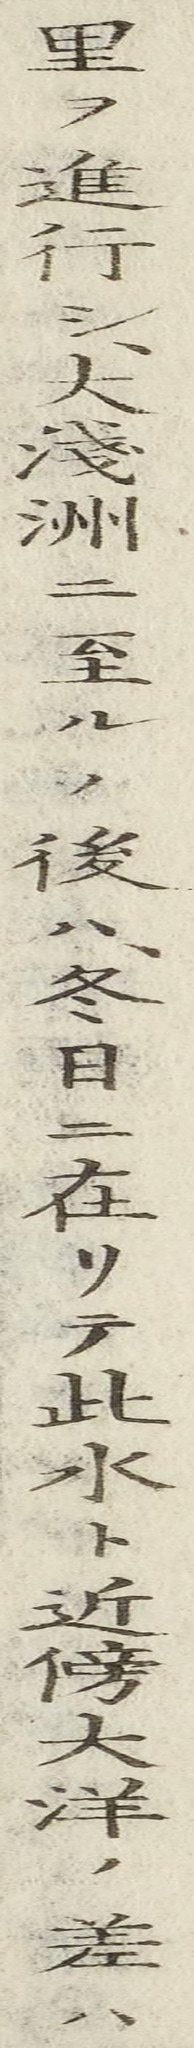里ヲ進行シ、大浅洲ニ至ルノ後ハ、冬日ニ在リテ此水ト近傍大洋ノ差ハ
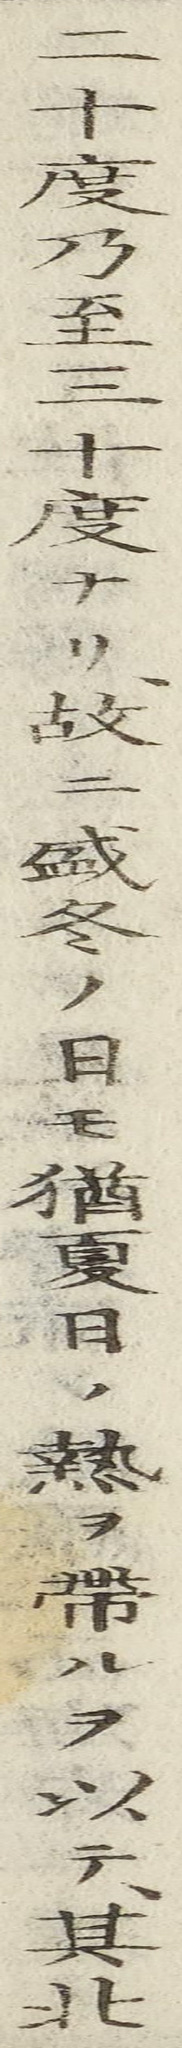二十度乃至三十度ナリ、故ニ盛冬ノ日モ猶夏日ノ熱ヲ帯ルヲ以テ、其北

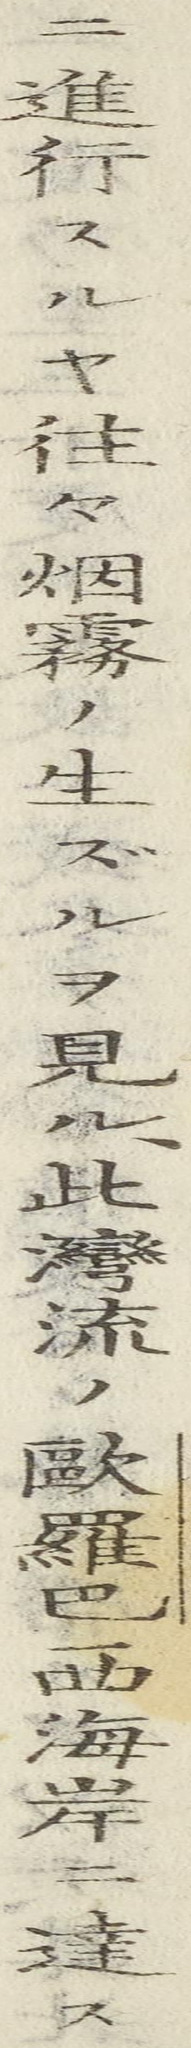ニ進行スルヤ往々烟霧ノ生ズルヲ見ル、此湾流ノ欧羅巴西海岸ニ達ス
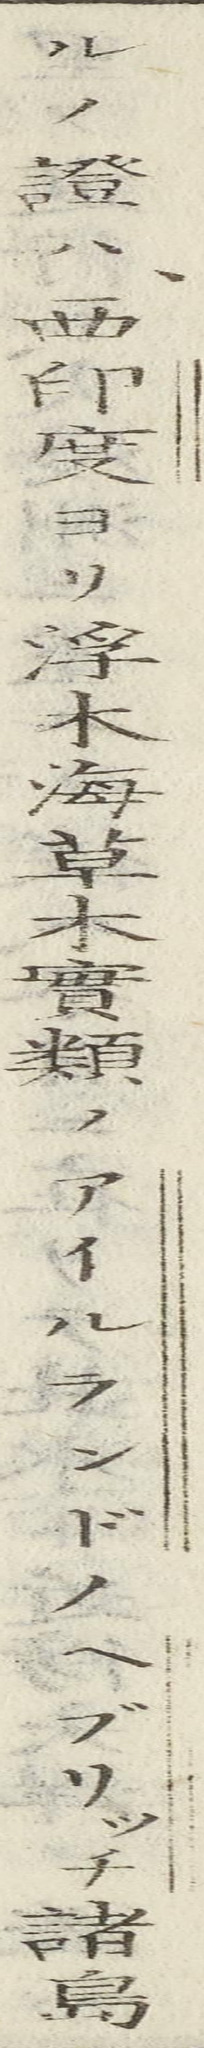ルノ証ハ、西印度ヨリ浮木海草木実類ノアイルランドノヘブリッチ諸島
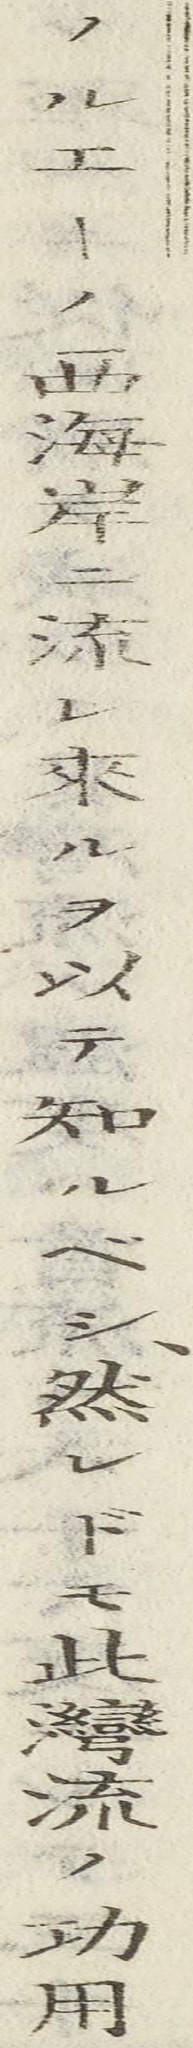ノルエーノ西海岸ニ流レ来ルヲ以テ知ルベシ、然レドモ此湾流ノ功用
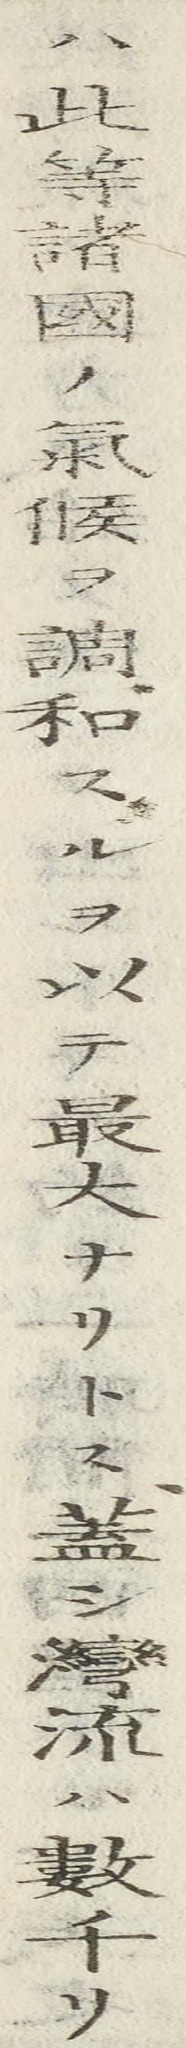ハ此等諸国ノ気候ヲ調和スルヲ以テ最大ナリトス、蓋シ湾流ハ数千リ
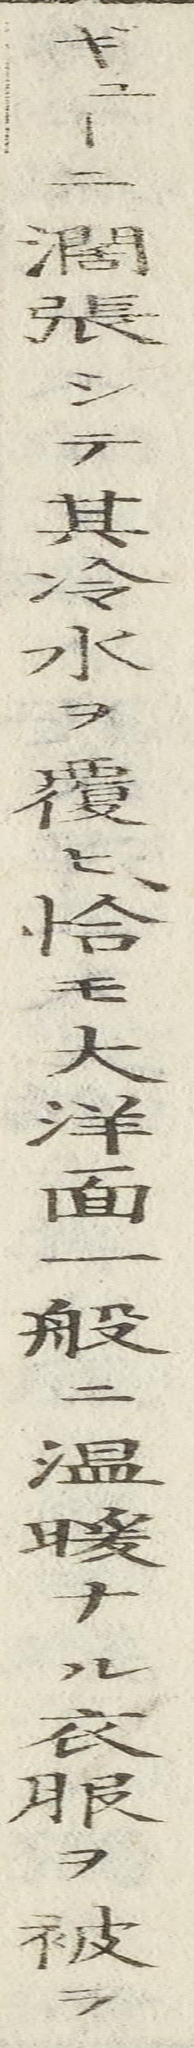ギューニ濶張シテ其冷水ヲ覆ヒ、恰モ大洋面一般ニ温暖ナル衣服ヲ被ラ
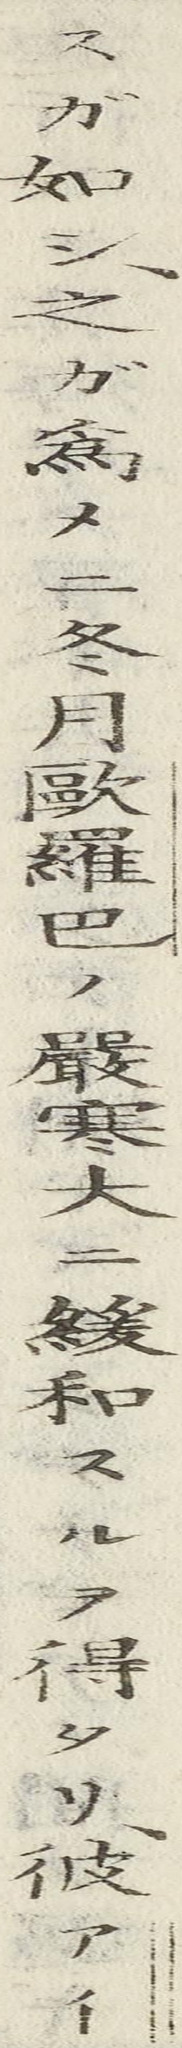スガ如シ、之ガ為メニ冬月欧羅巴ノ厳寒大ニ緩和スルヲ得タリ、彼アイ
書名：百科全書　地文學　全
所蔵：東京大学地震研究所図書室 Earthquake Research Institute Library, The University of Tokyo, JAPAN
